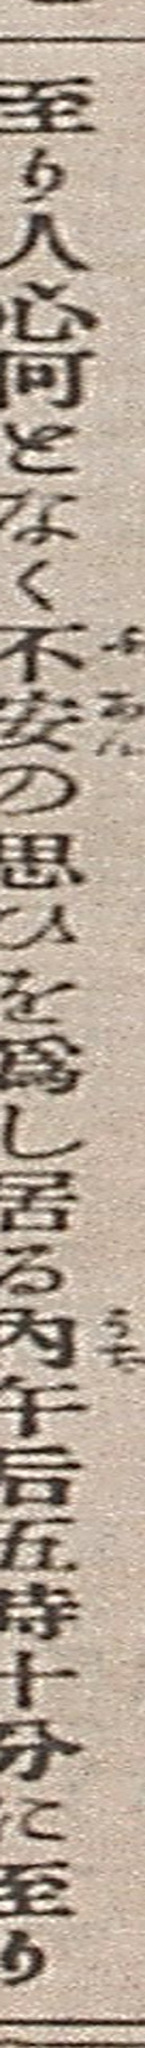至り人心何となく不安の思ひを為し居る内午后五時十分に至り
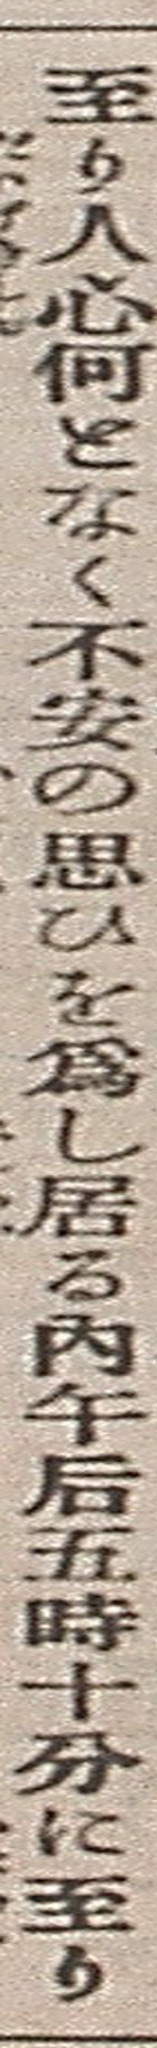至り人心何となく不安の思ひを為し居る内午后五時十分に至り
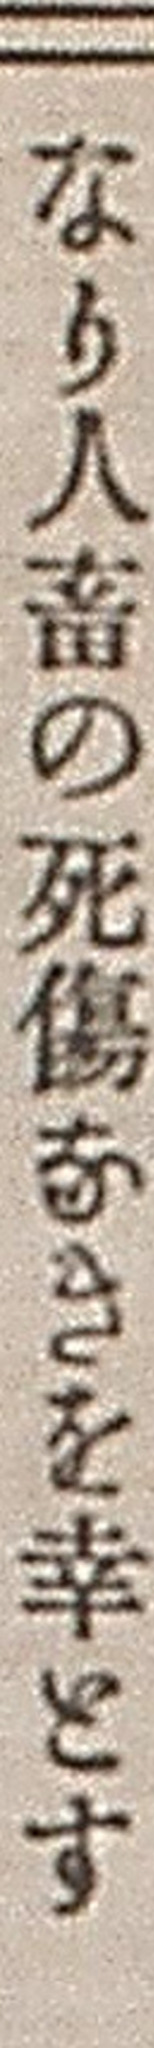なり人畜の死傷なきを幸とす
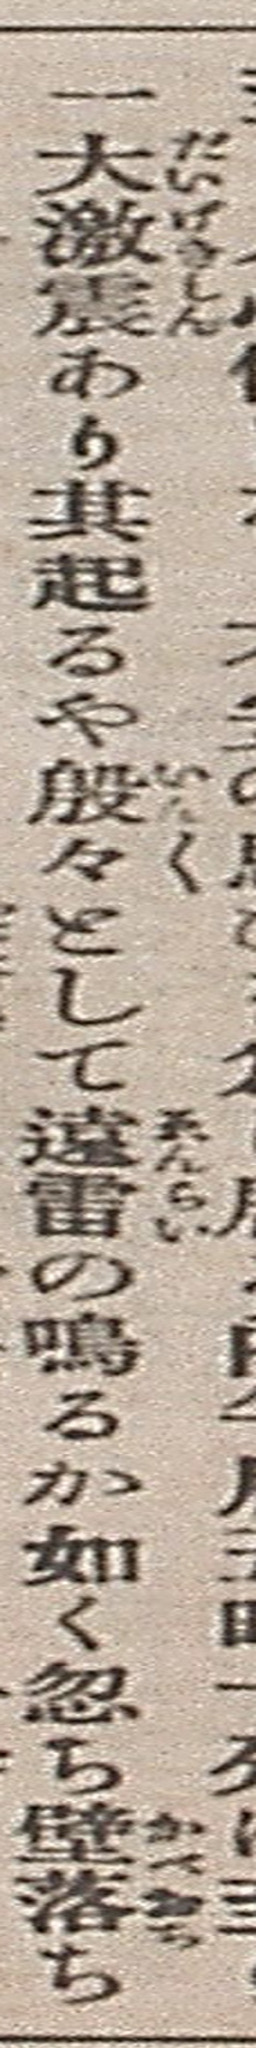一大激震あり其起るや殷々として遠雷の鳴るか如く忽ち壁落ち
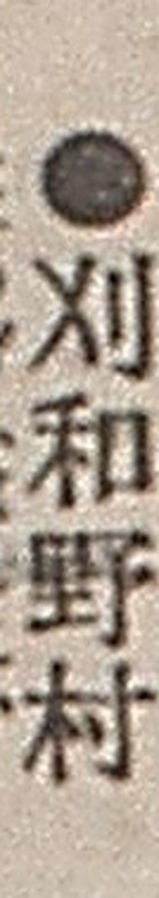●刈和野村
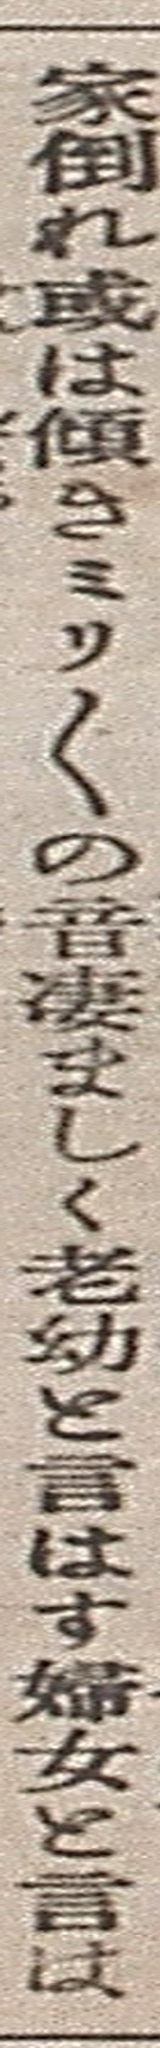家倒れ或は傾きミリ〳〵の音凄ましく老幼と言はす婦女と言は
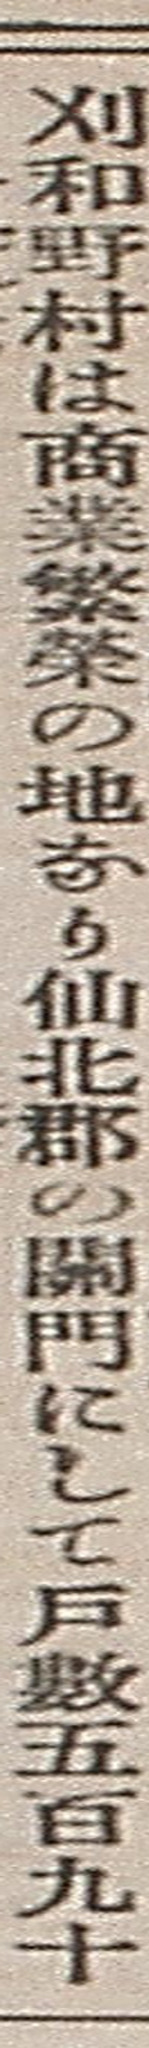刈和野は商業繁栄の地なり仙北郡の関門にして戸数五百九十
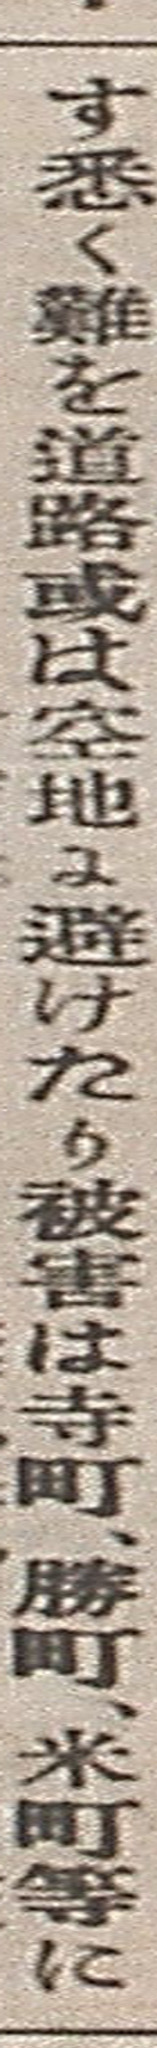す悉く難を道路或は空地に避けたり被害は寺町、勝町、米町等に
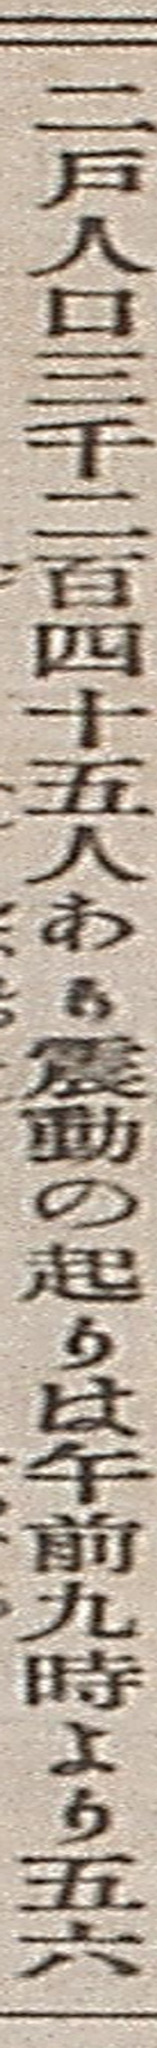ニ戸人口三千二百四十五人あり震動の起りは午前九時より五六
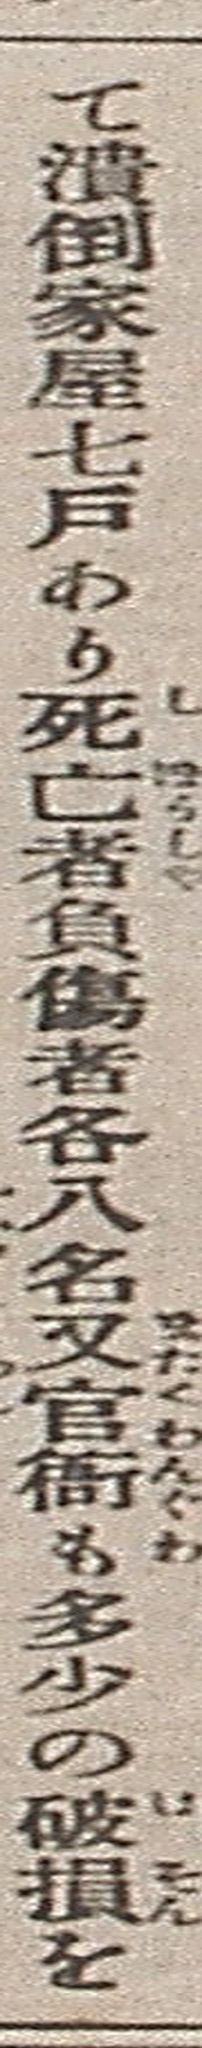て潰倒家屋七戸あり死亡者負傷者各八名又官衙も多少の破損を
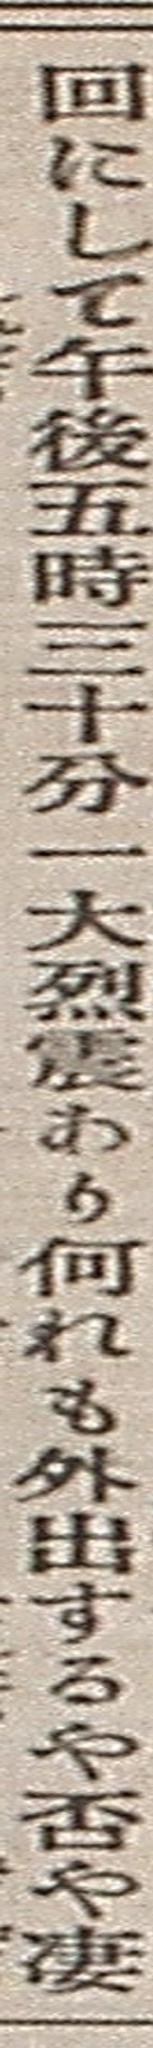回にして午後五時三十分一大烈震あり何れも外出するや否や凄
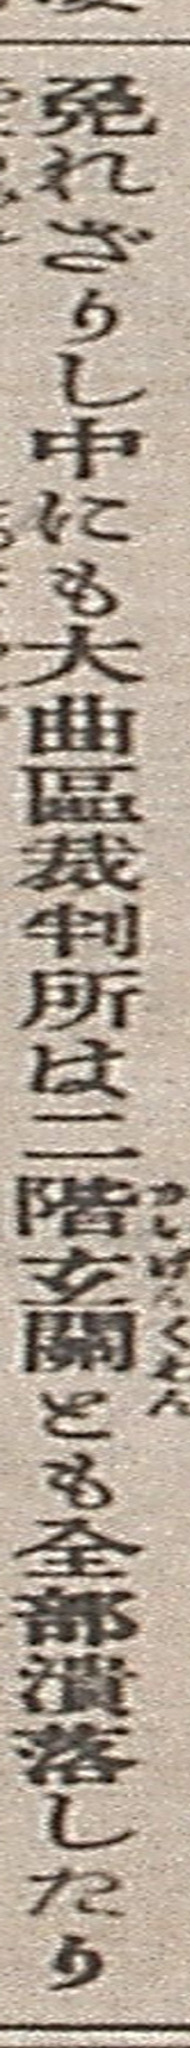免れざりし中にも大曲区裁判所は二階玄関とも全部潰落したり
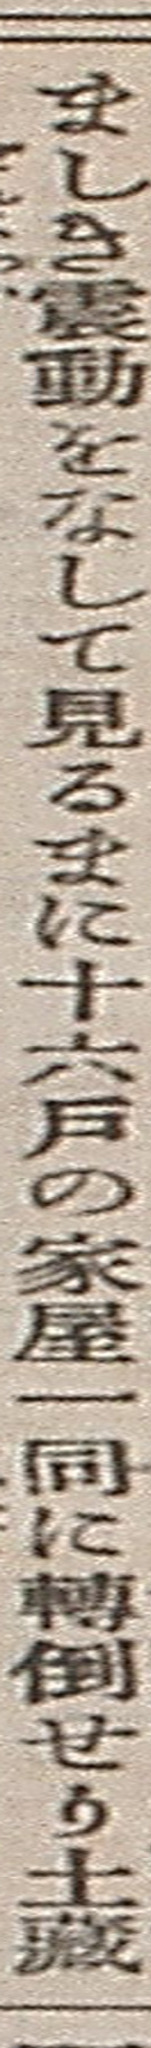ましき震動をなして見るまに十六戸の家屋一同に転倒せり土蔵
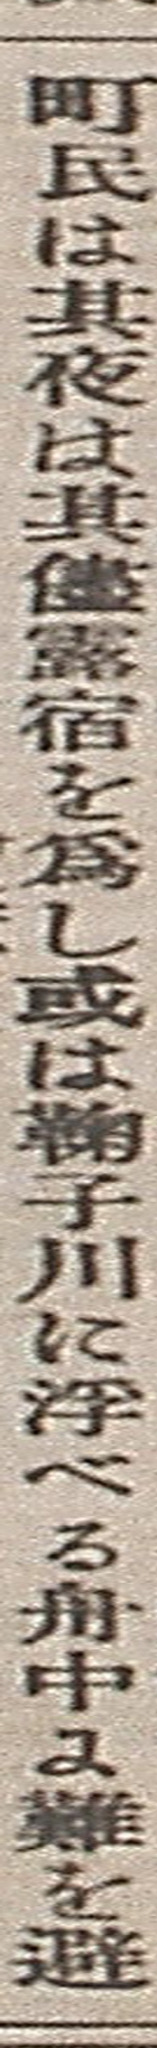町民は其夜は其侭路宿を為し或は鞠子川に浮べる舟中に難を避
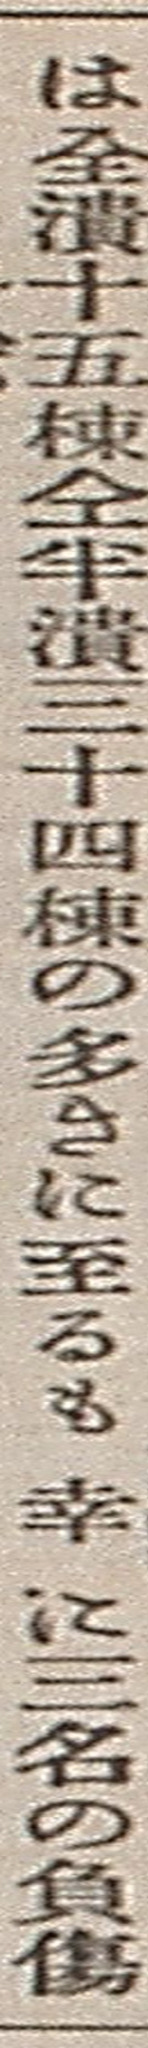は全潰十五棟仝半潰三十四棟の多きに至るも幸に三名の負傷
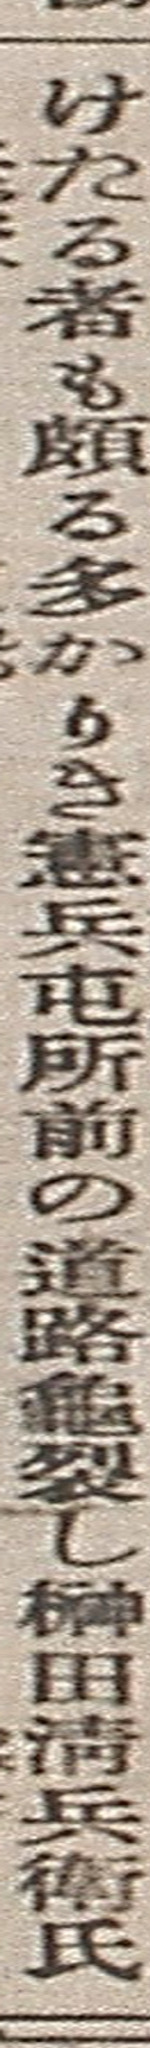けたる者も頗る多かりき憲兵屯所前の道路亀裂し榊田清兵衛氏
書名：風俗畫報臨時増刊第百二十四號　洪水地震被害録（上）
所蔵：東京大学地震研究所図書室 Earthquake Research Institute Library, The University of Tokyo, JAPAN
